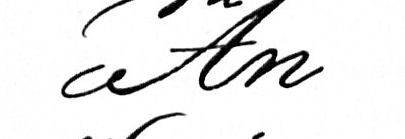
An
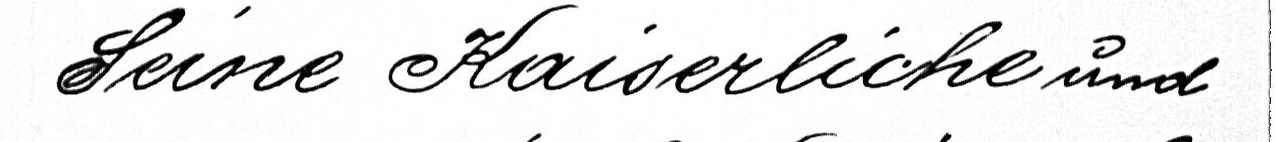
Seine Kaiserliche und
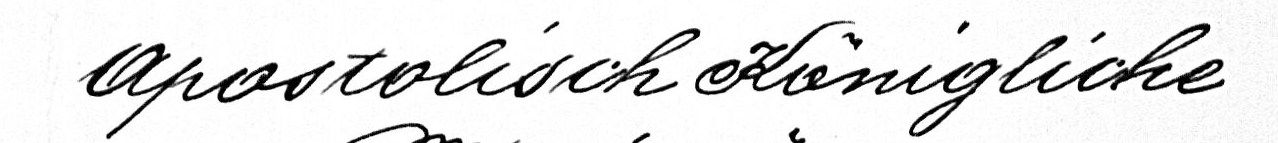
Apostolisch Königliche
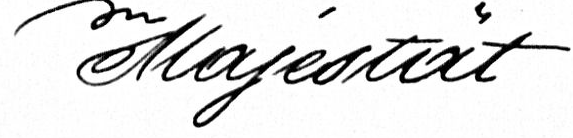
Majestät
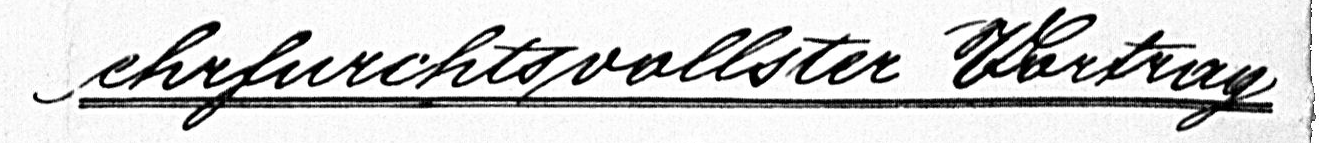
ehrfarchtsvollster Vortrag
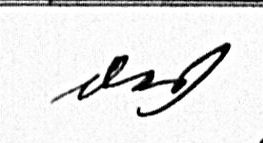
des
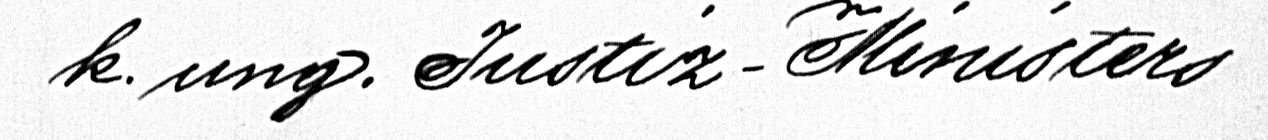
k. ung. Justiz - Ministers
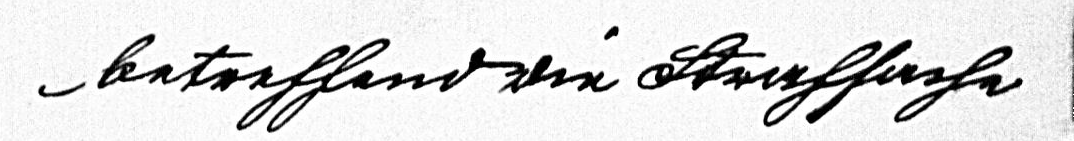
betreffend die Strafsache
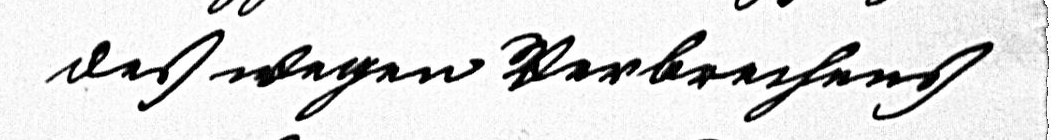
des wegen Verbrechens
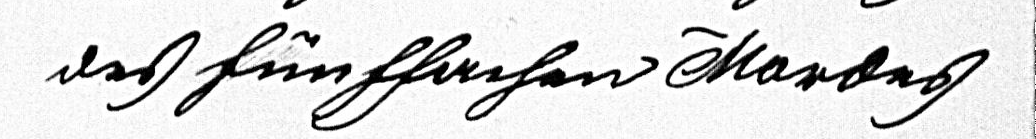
des fünffachen Mordes
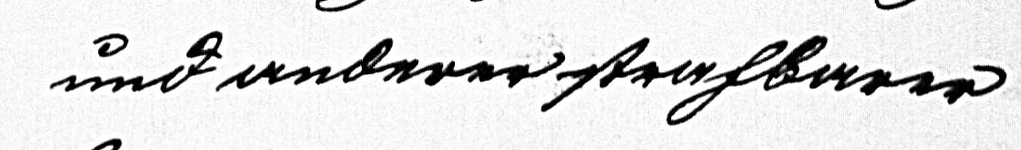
und anderer strafbarer
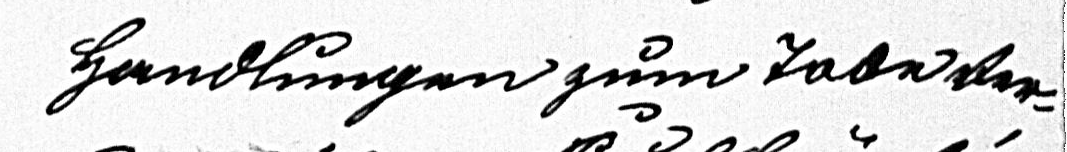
Handlungen zum Tode ver¬
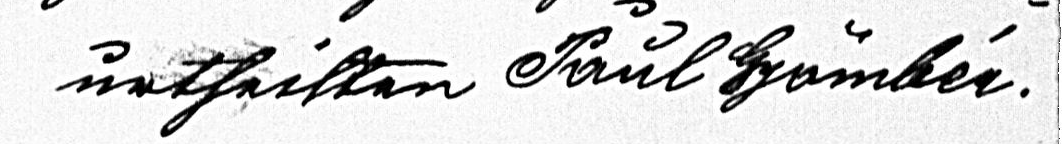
urtheilten Paul Gyömbér.
